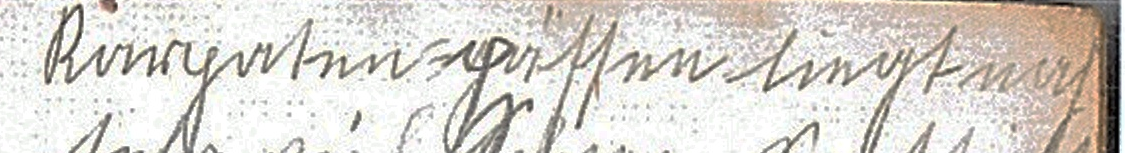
Knraatenrstenlugtma
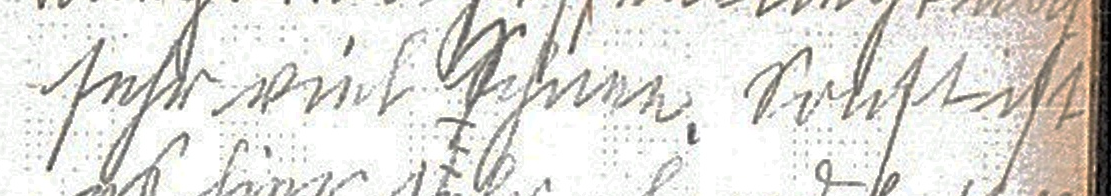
secht a hie olcht n
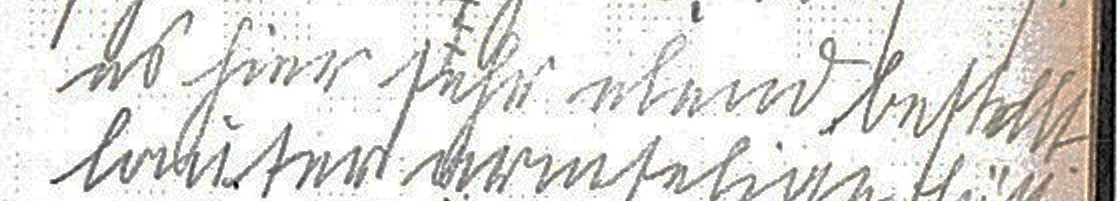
es lier, siend elendtetelit
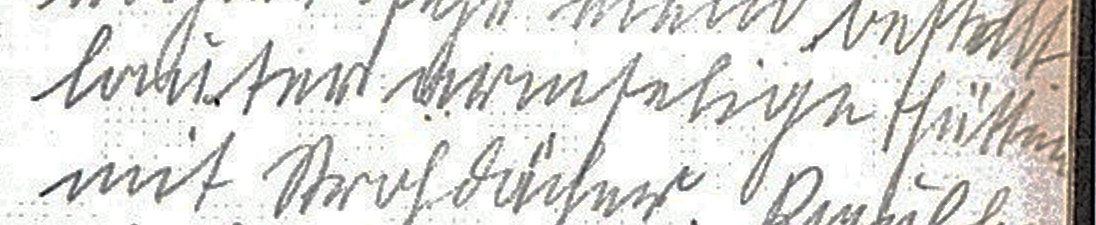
druter truntelege aäten
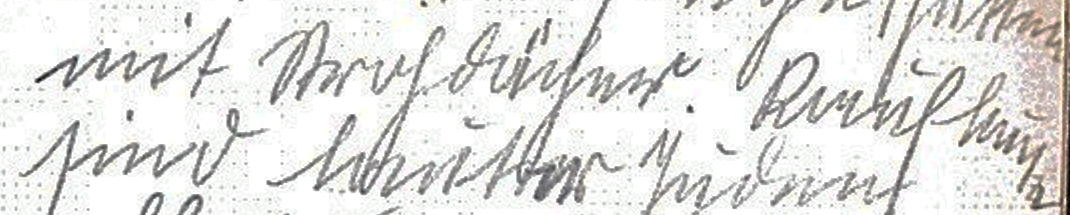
mit Srchbäter. auflang
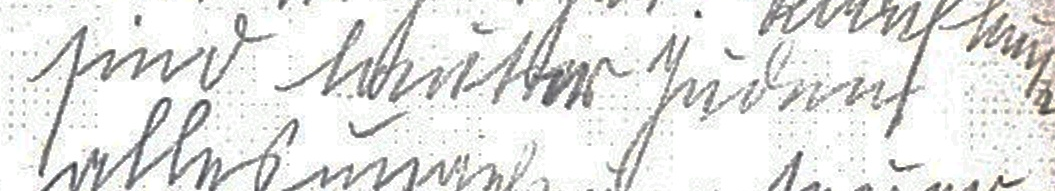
sund santer Seitang s
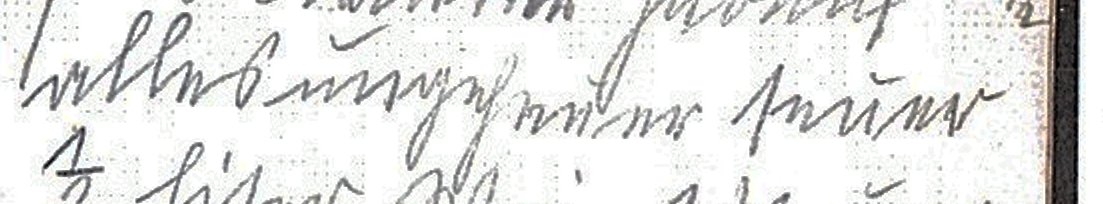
allengchener seues2
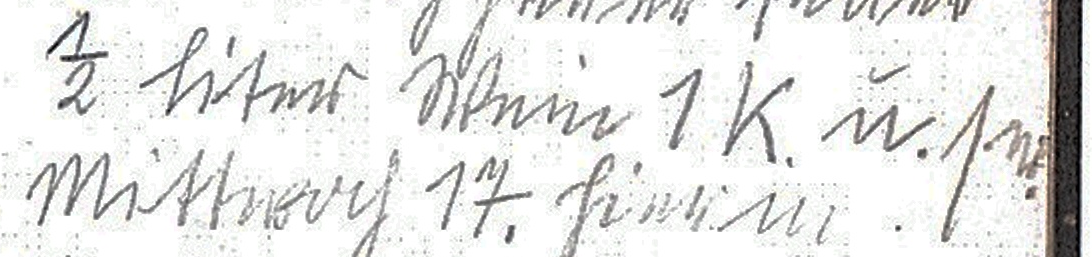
3 liter Wen 1. unisag
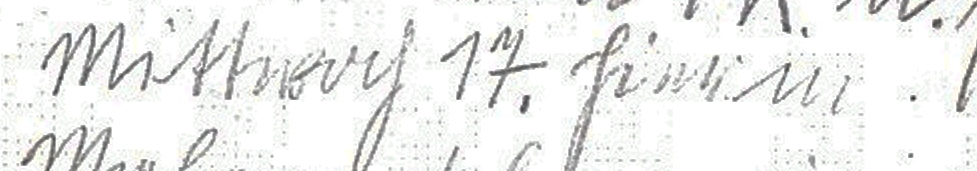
Mtitterch 1 isi
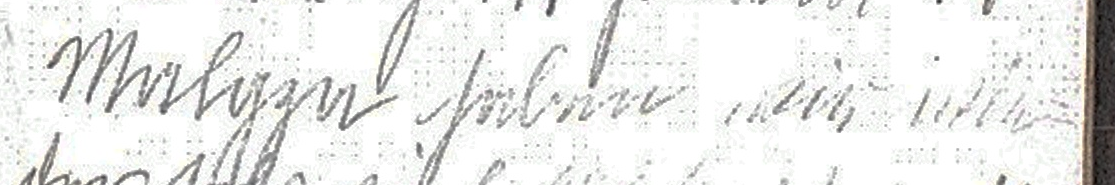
Malaen baen ie e
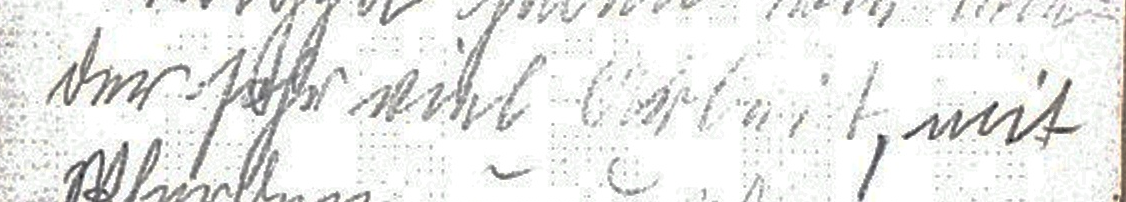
de ilhr lch aernt mit
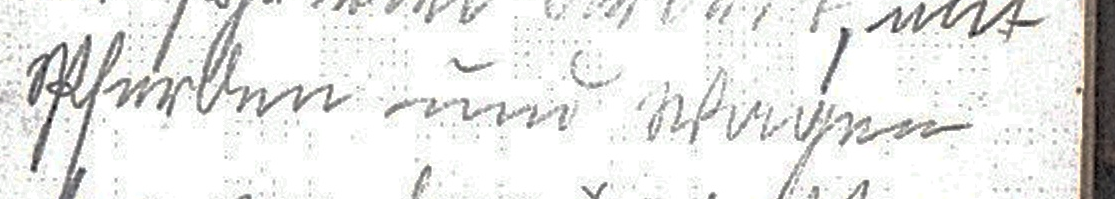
Shürken n ngen
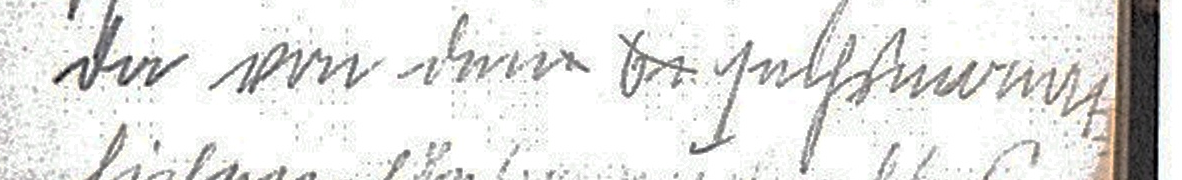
de vin der r sestannah
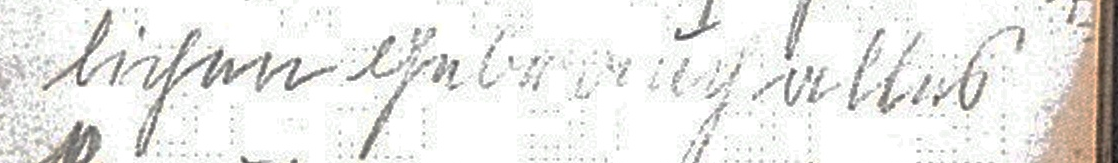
blichem ieagr sch alles
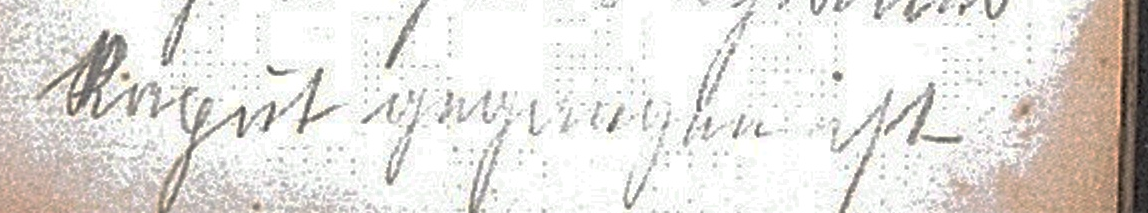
reut aindthrde ei
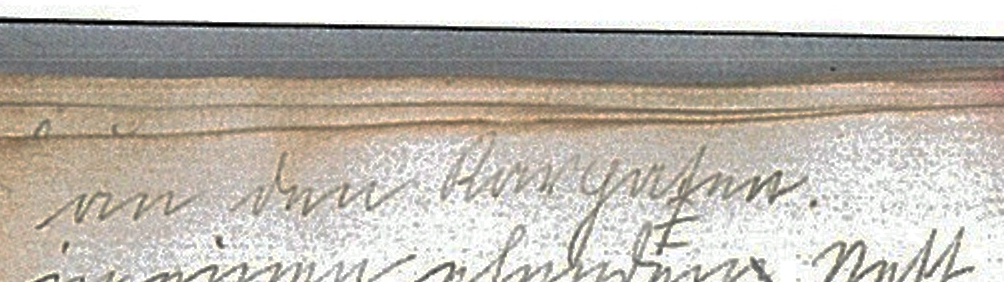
an den Karpaten.
